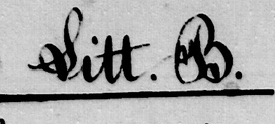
Litt. B.
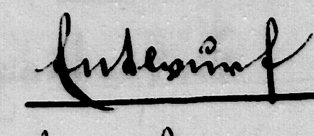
Entwurf
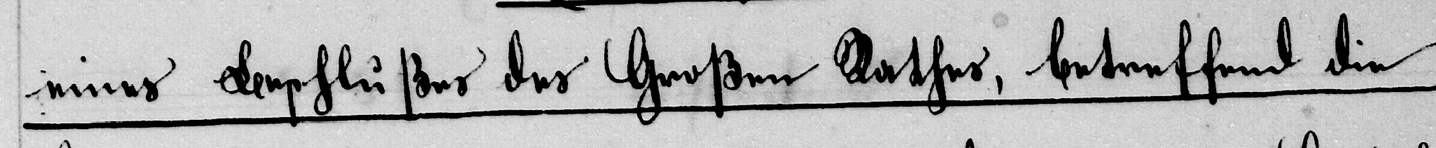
eines Beschlußes des Großen Rathes, betreffend die
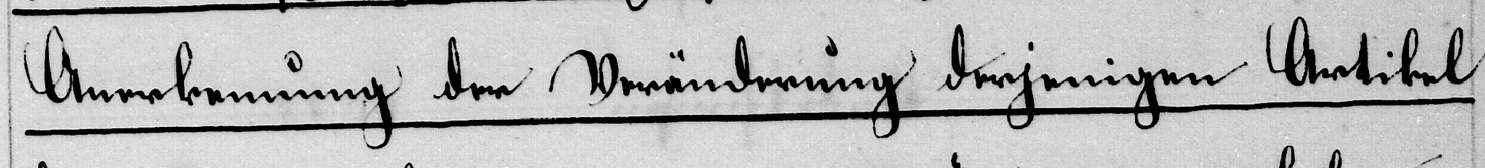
Anerkennung der Veränderung derjenigen Artikel
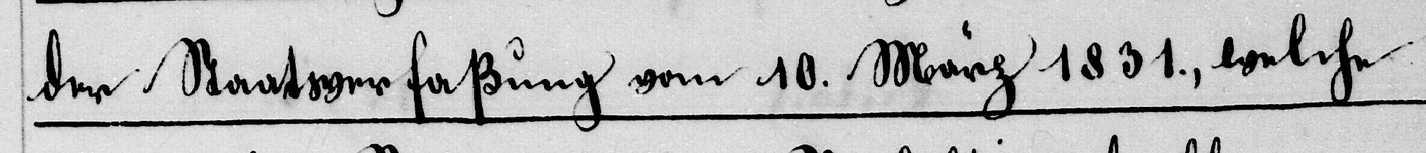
der Staatsverfaßung vom 10. März 1831., welche
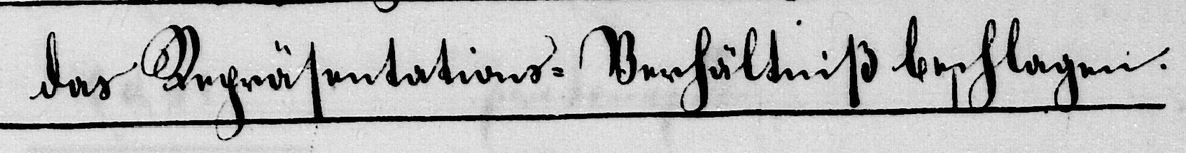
das Repräsentations-Verhältniß beschlagen.
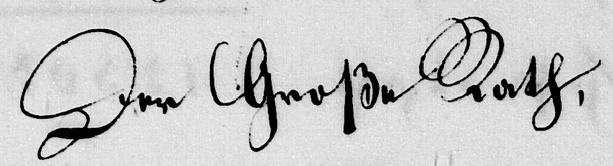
Der Große Rath,
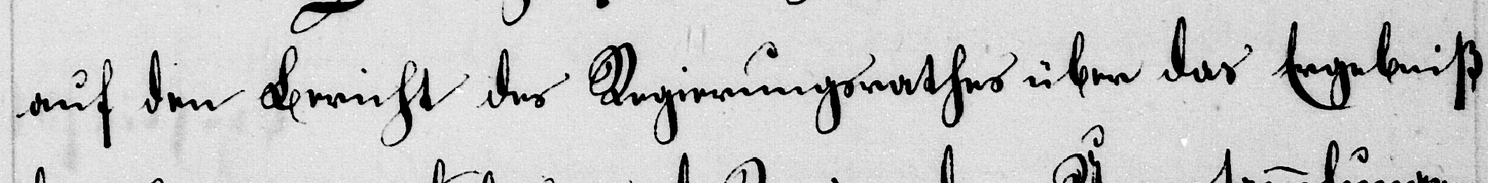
auf den Bericht des Regierungsrathes über das Ergebniß
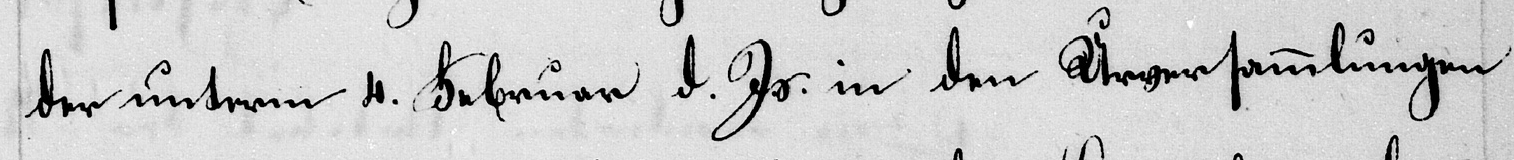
der unterm 4. Februar d. Js. in den Urversammlungen
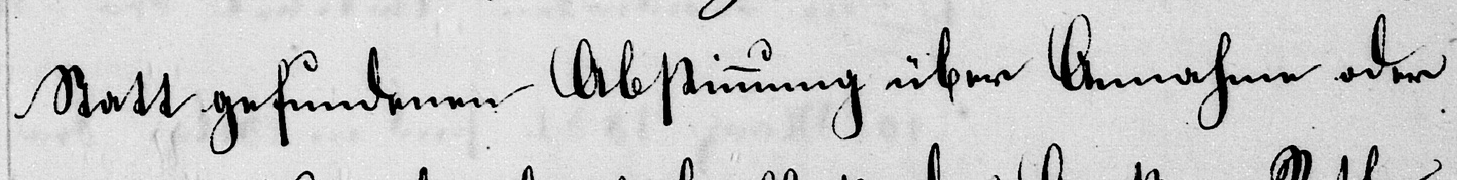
Statt gefundenen Abstimmung über Annahme oder
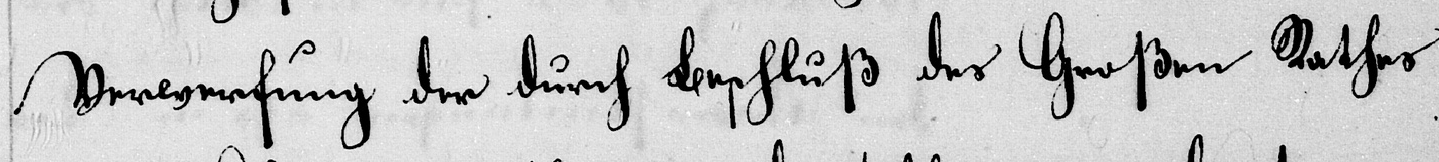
Verwerfung der durch Beschluß des Großen Rathes
